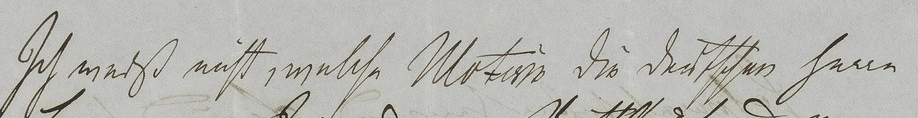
Ich weiß nicht, welche Motive die deutschen Herrn
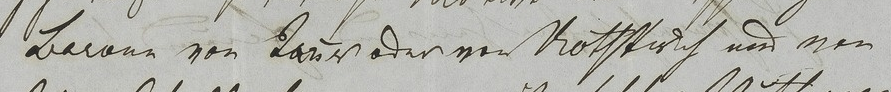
Barone von Taur oder von Rothkirch und von
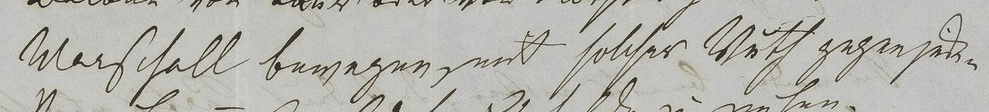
Marschall bewegen, mit solcher Wuth gegen jeden
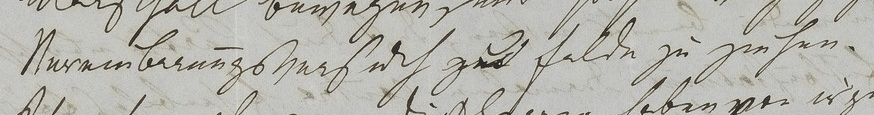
Vereinbarungsversuch zu Felde zu ziehen.
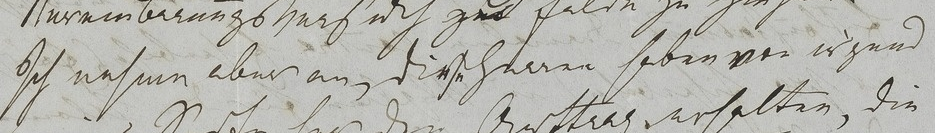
Ich nehme aber an, die Herren haben von irgend-
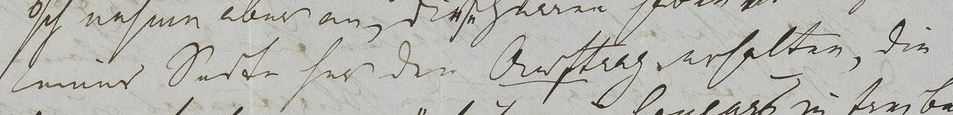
einer Seite her den Auftrag erhalten, die
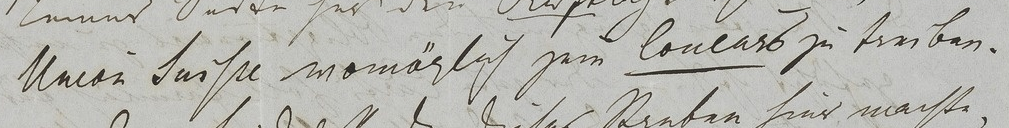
Union Suisse womöglich zum Concurs zu treiben.
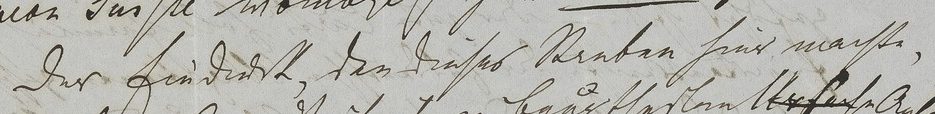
Der Eindruck, den dieses Streben hier machte,
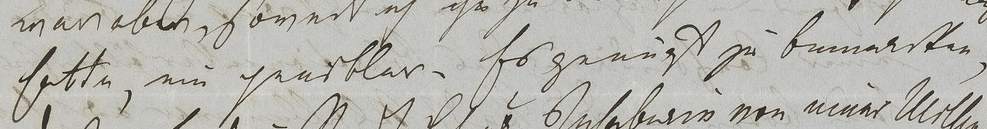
hatte, ein penibler. Es genügt zu bemercken,
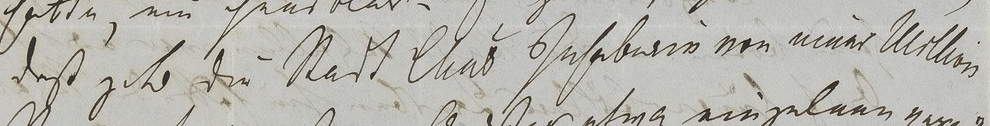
daß z. B. die Stadt Chur Inhaberin von einer Million
